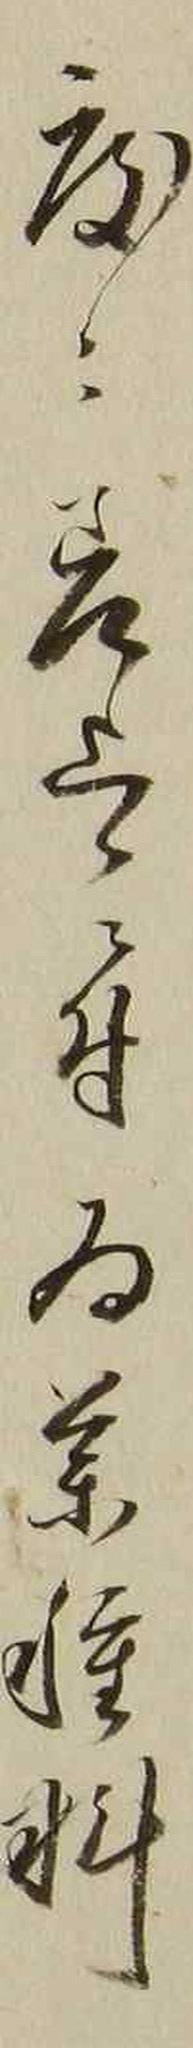度々差上候ニ付為薬種料
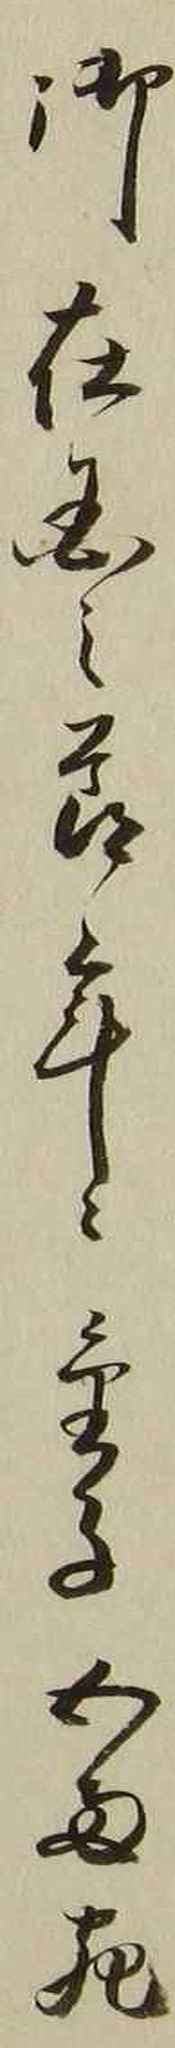御在国之節年ニ金子五両宛
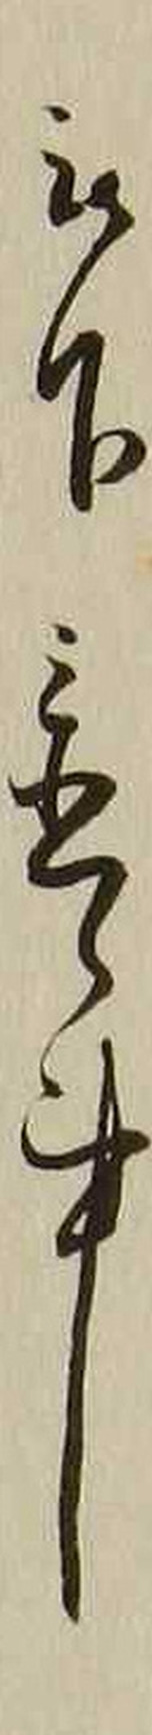被下置候事
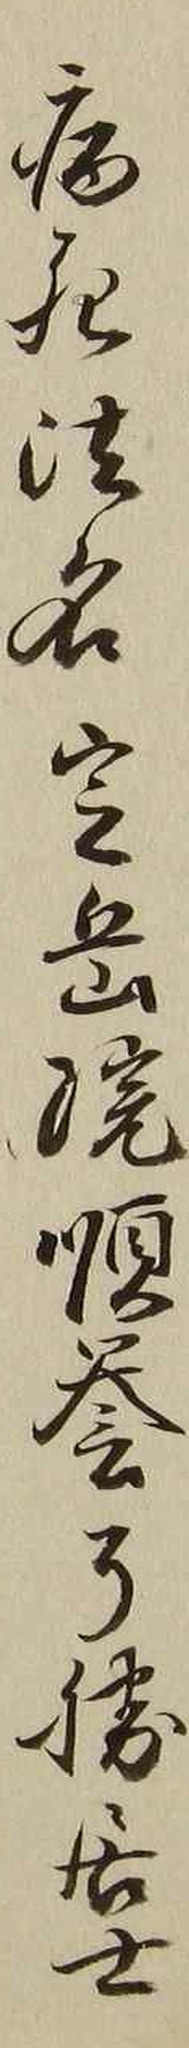病死法名定岳院順誉了勝居士
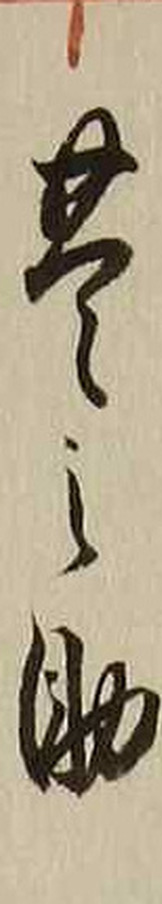豊之助
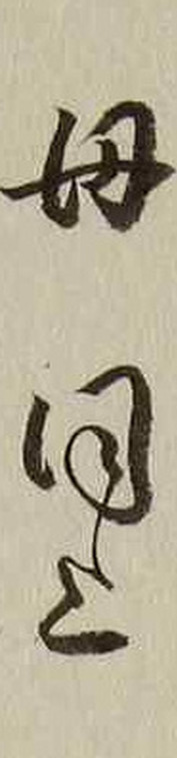母同上
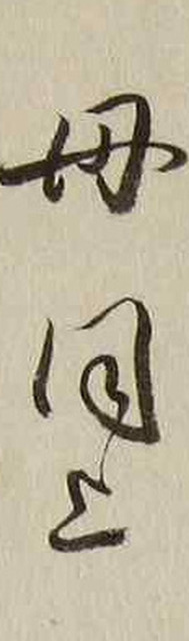母同上
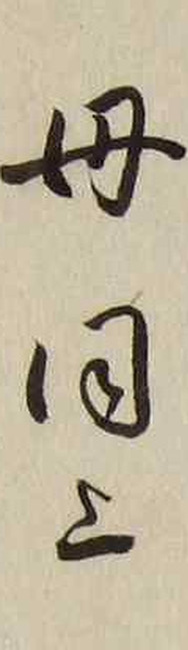母同上

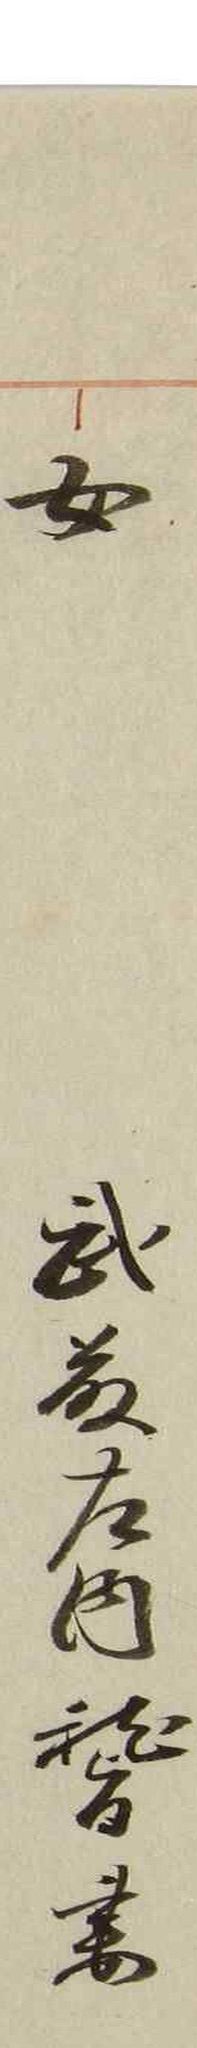女武藤左内稽妻
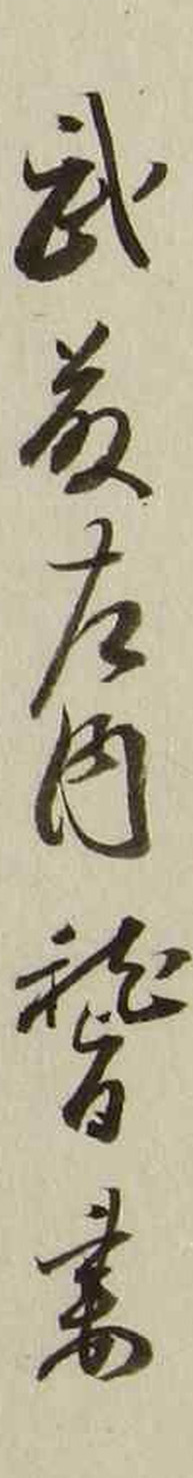女武藤左内稽妻
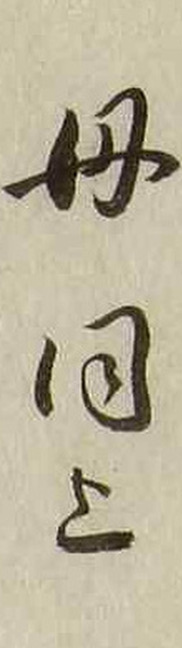母同上
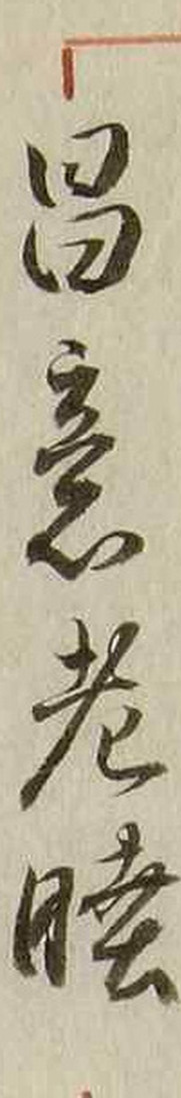昌意老睦
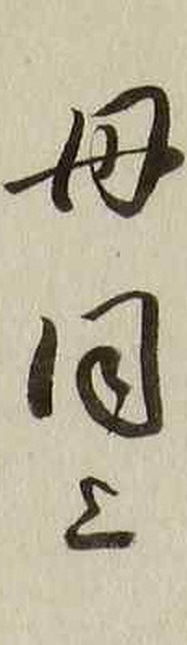母同上
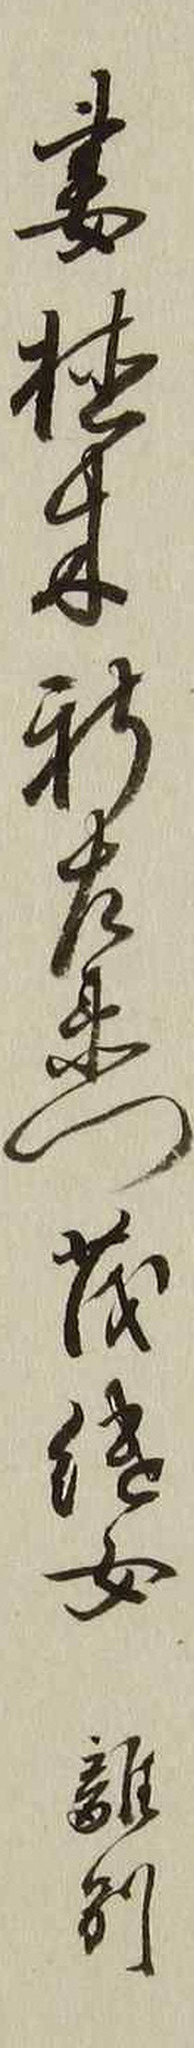妻植木新左衛門茂継女離別
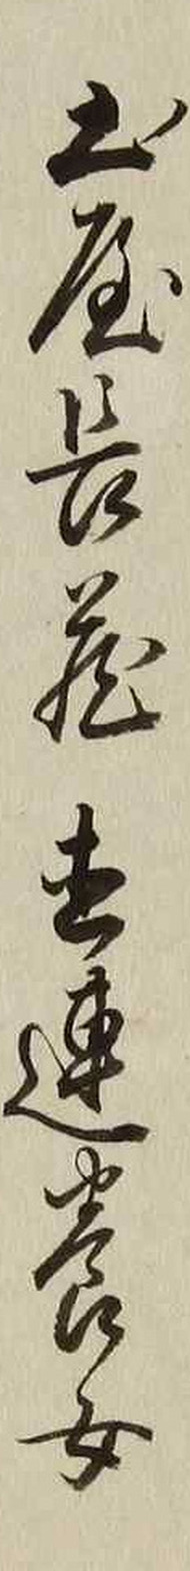土屋長蔵直連養女
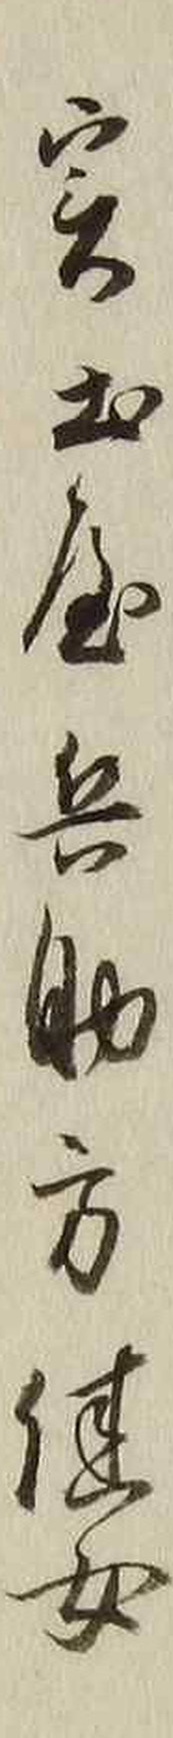実土屋兵助方佳女
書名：諸士系譜　巻之52　に之部3
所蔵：会津若松市立会津図書館
